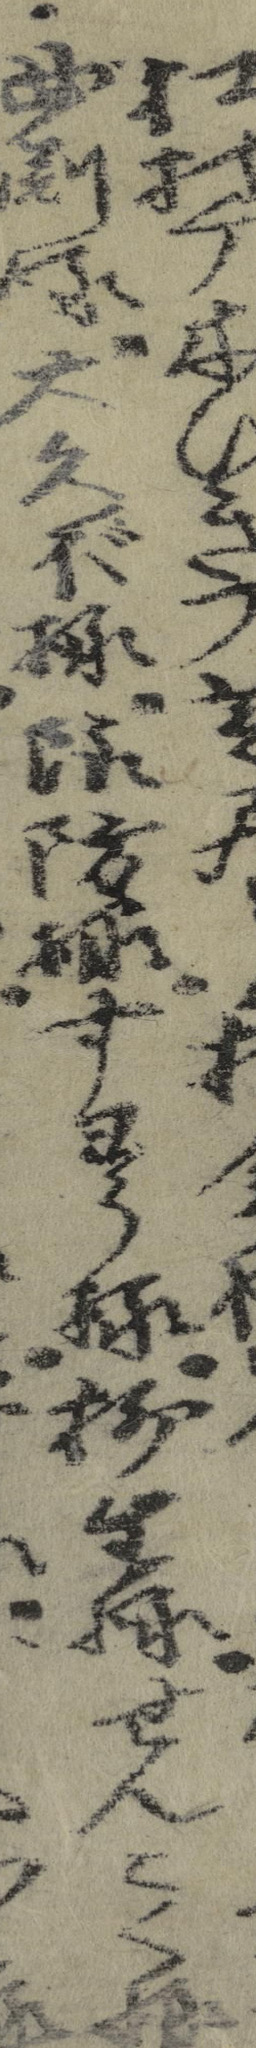曲淵様大久ぼ様諏訪様すほう様●柳生様●せんこく様
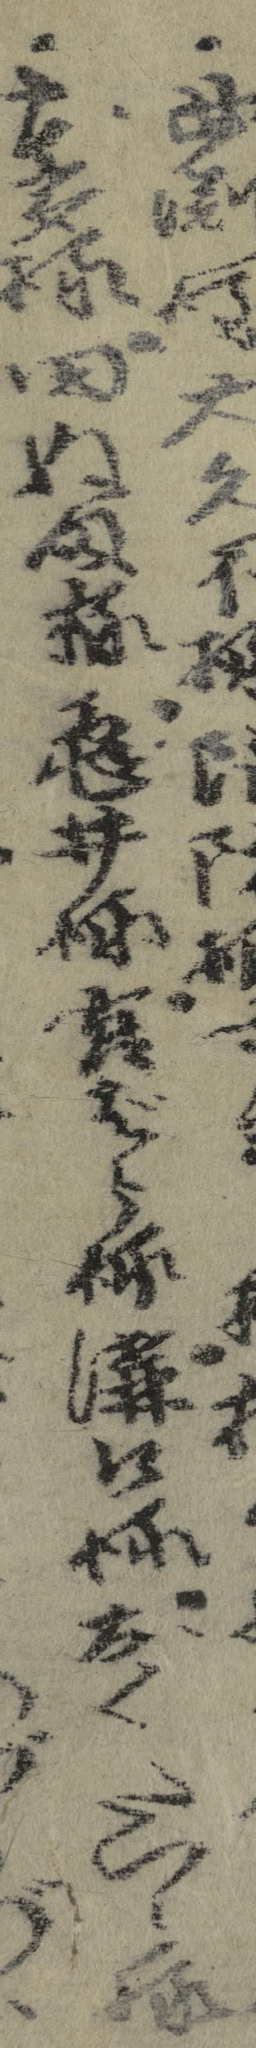本多様田ぬま様●亀井様●宮ばら様●溝口様おくたひら様
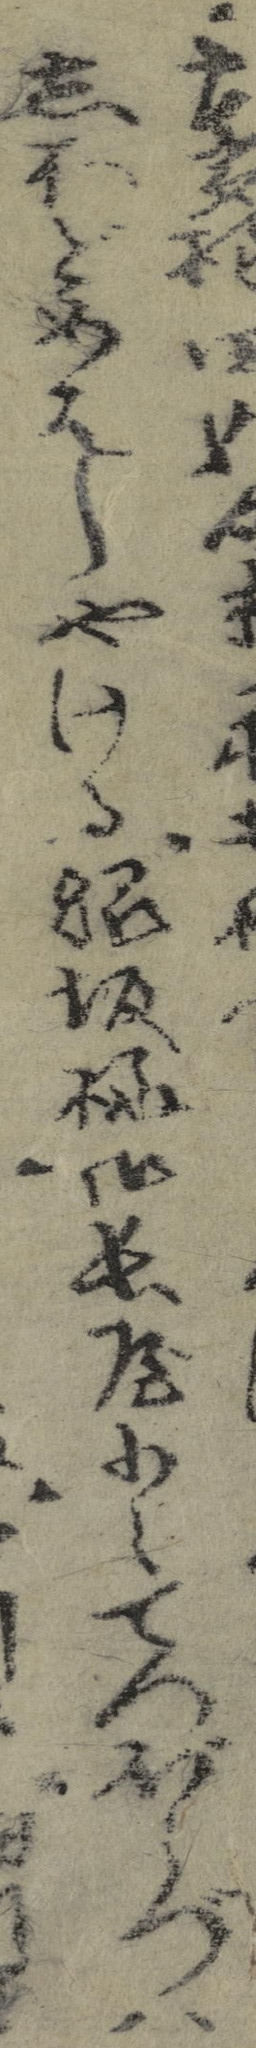しほどめはしやける▲脇坂様御長屋少々てつほうつは
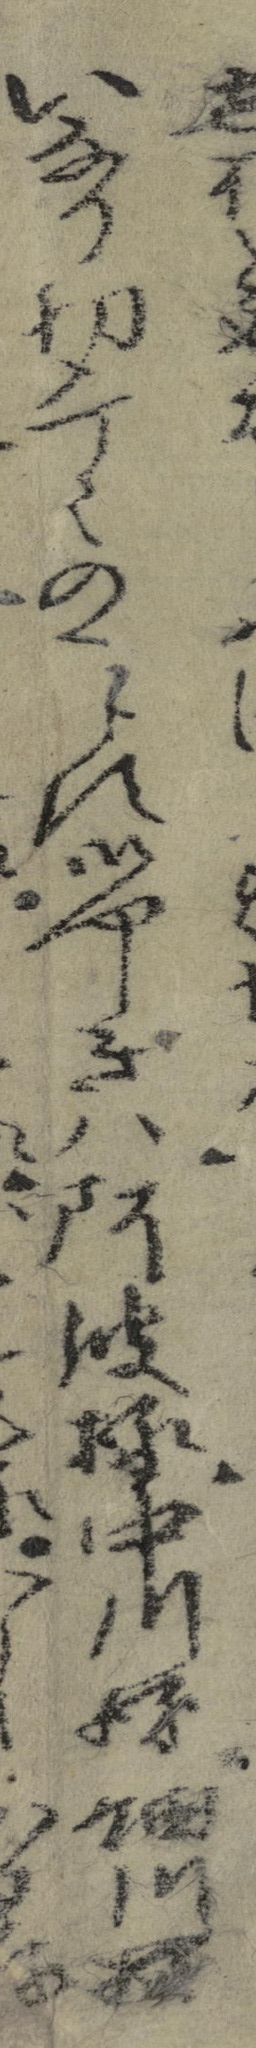いなり初め丁々のこらず御やしきは▲阿波様▲中川様▲細川様
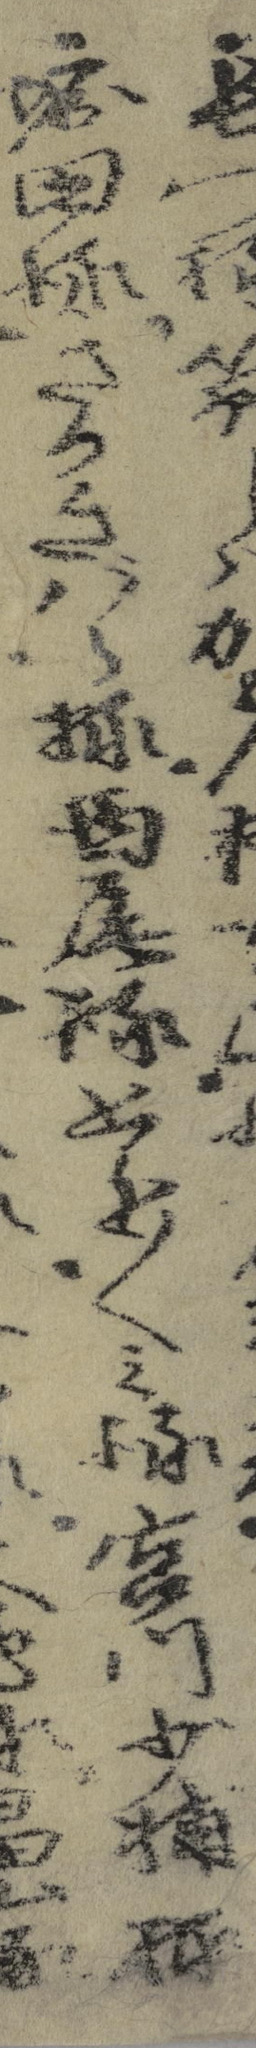堀田様●さかきばら様▲西尾様とを〳〵み様●宮川少輔様
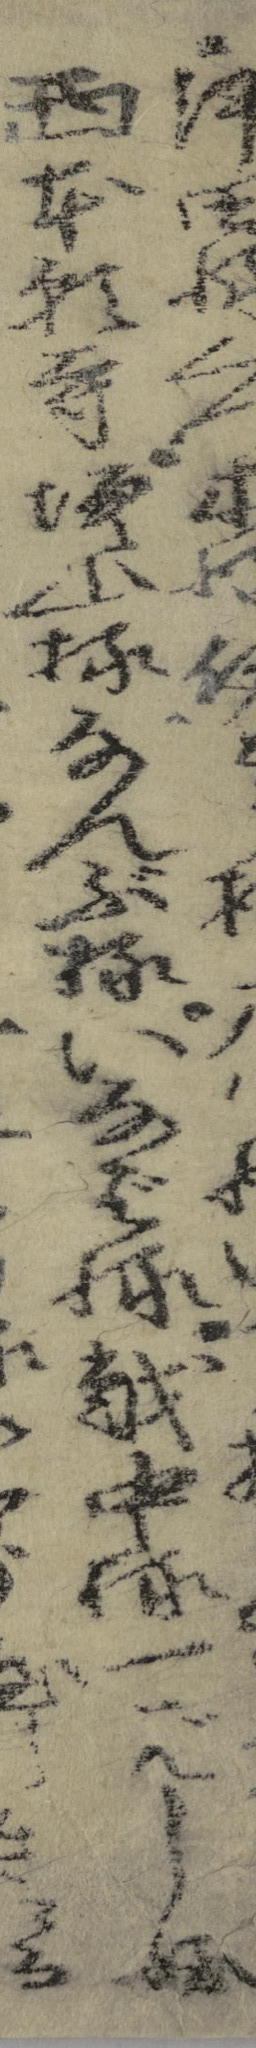西本願寺●増山様●なんぶ様●いなば様越中様一ばし様
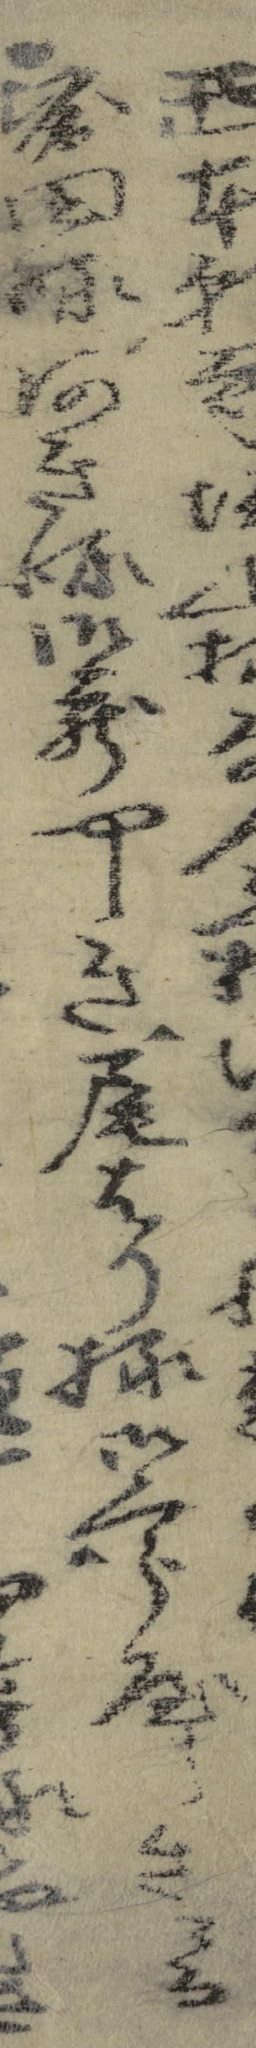●塚田様●あき様御蔵やしき▲尾はり様御くらやしきに而
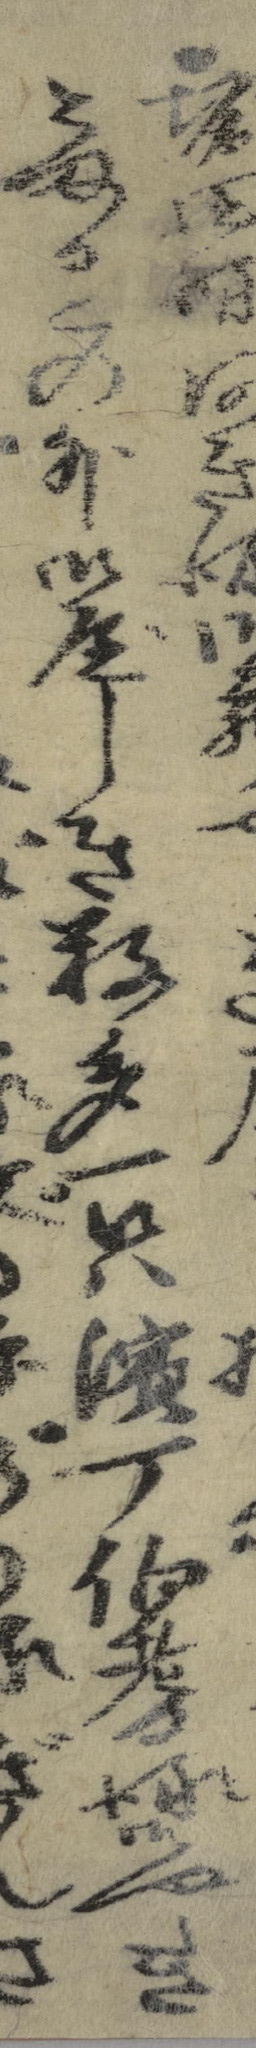とまるこの外御やしき数多一口は浜丁▲伯耆様御やしき
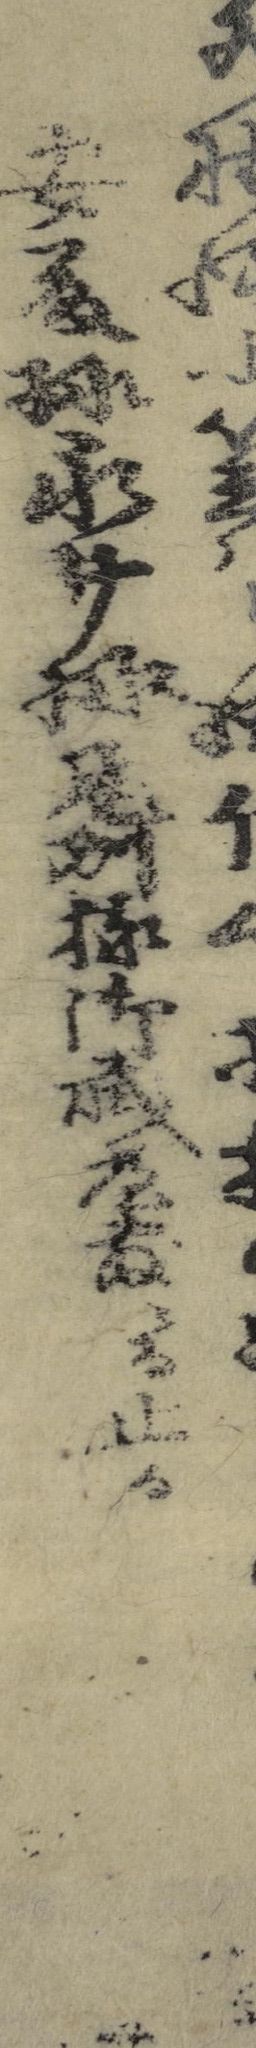安藤様永井様尾州様御蔵屋敷に而止る
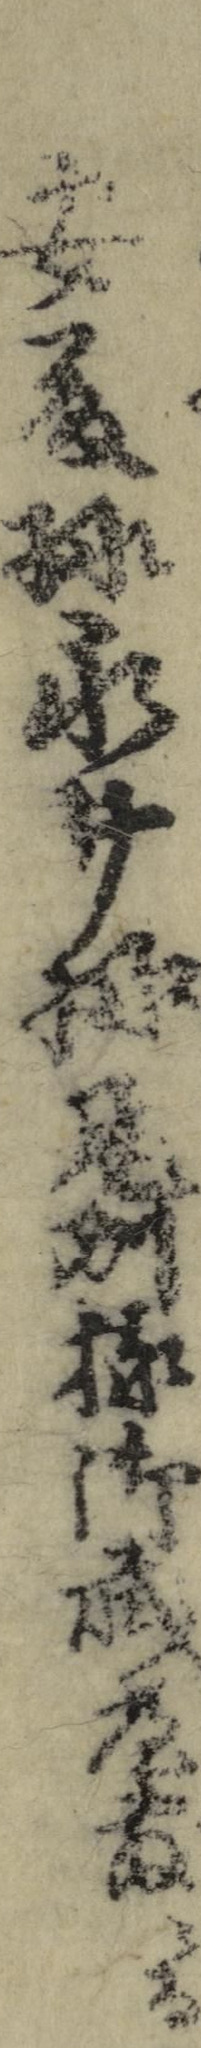安藤様永井様尾州様御蔵屋敷に而止る
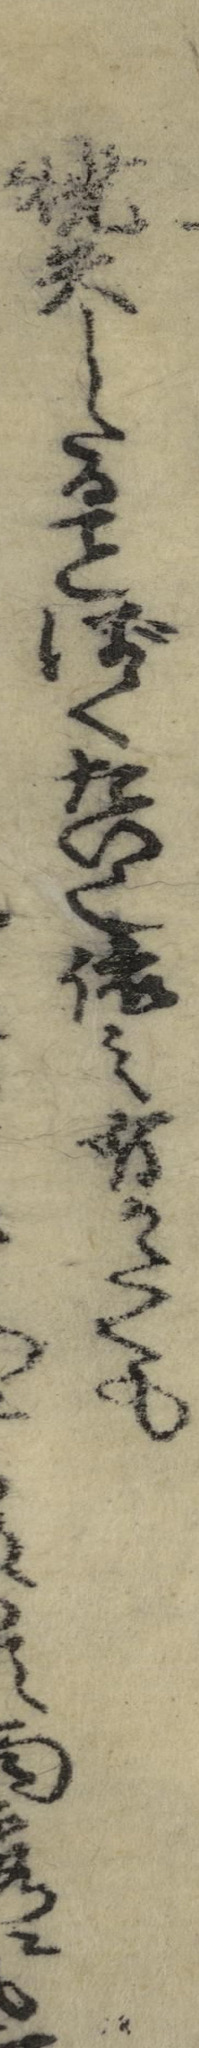焼失したることばくたい也依之有かたくも
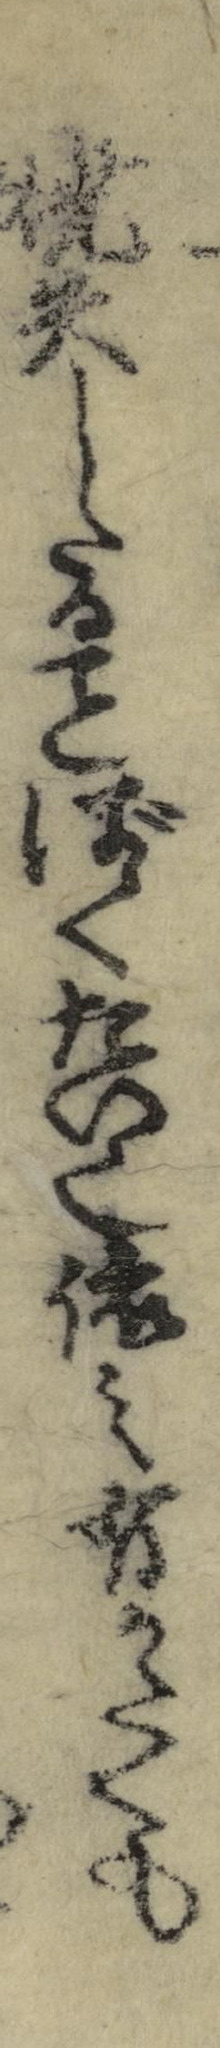焼失したることばくたい也依之有かたくも
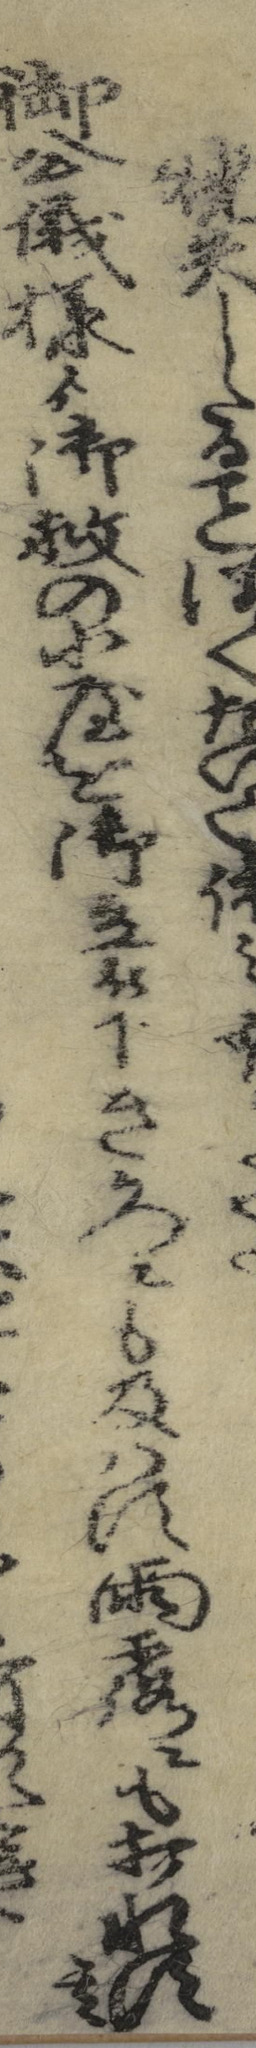御公儀様ゟ御救の小屋を御立被下きかつにも及はす雨露にも打れす其
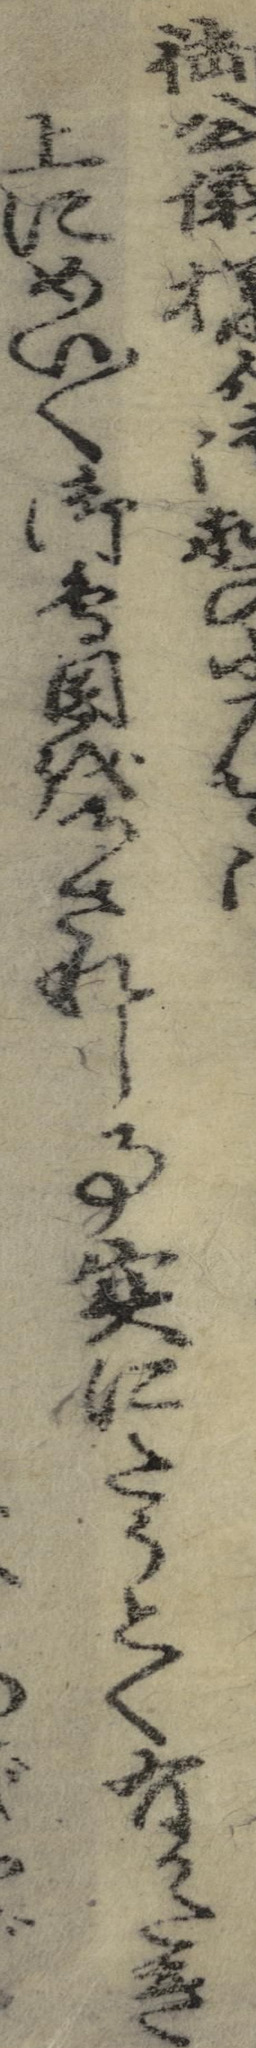上にめい〳〵御鳥目代下されし事実にたうとく有かたき
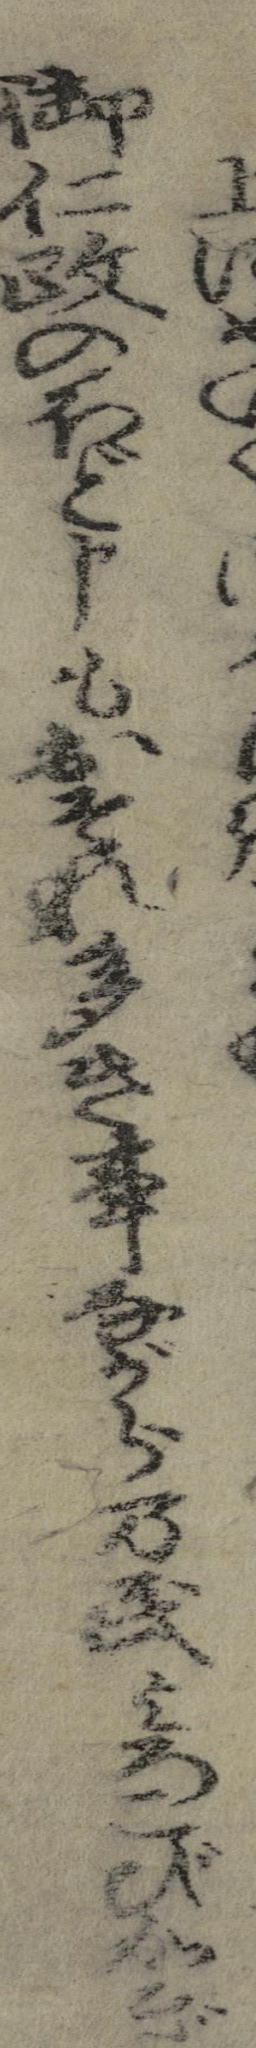御仁政のほど申もおそれ多き事まから万民よろこび
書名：方角場所附
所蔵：東京大学地震研究所図書室 Earthquake Research Institute Library, The University of Tokyo, JAPAN
